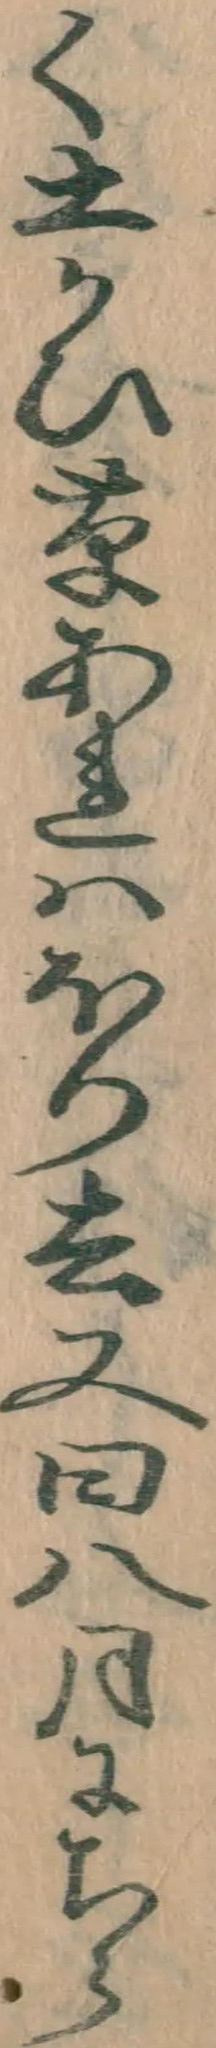く土かひ草あれはほり去又日八月にちら
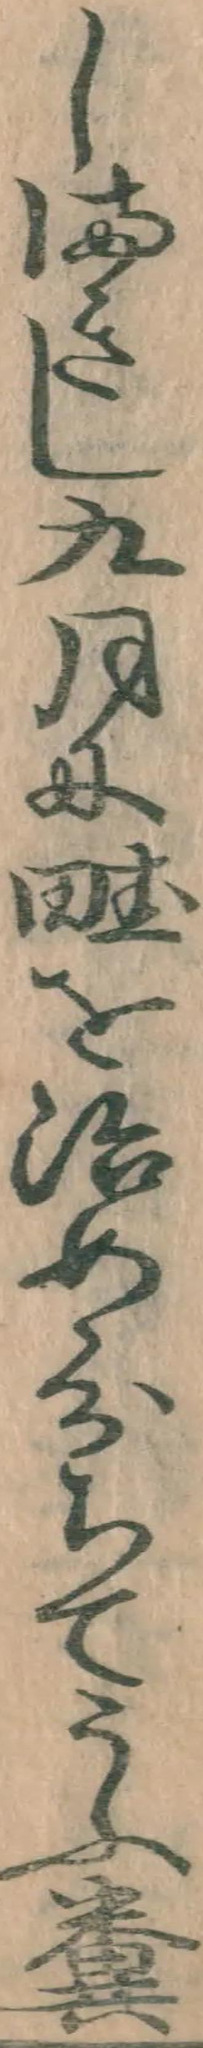しまきし九月に畦を治め分ちてうふ糞
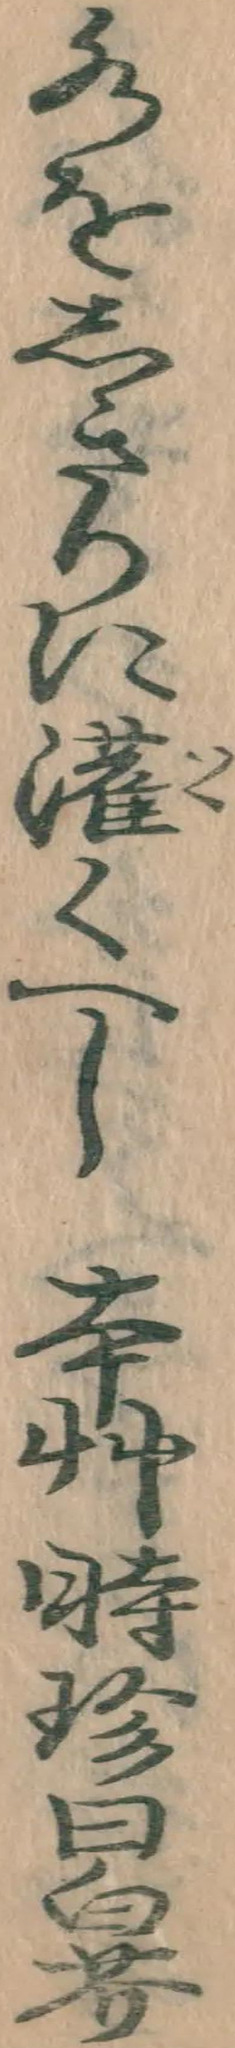水をしきりに灌くへし本艸時珍日白芥
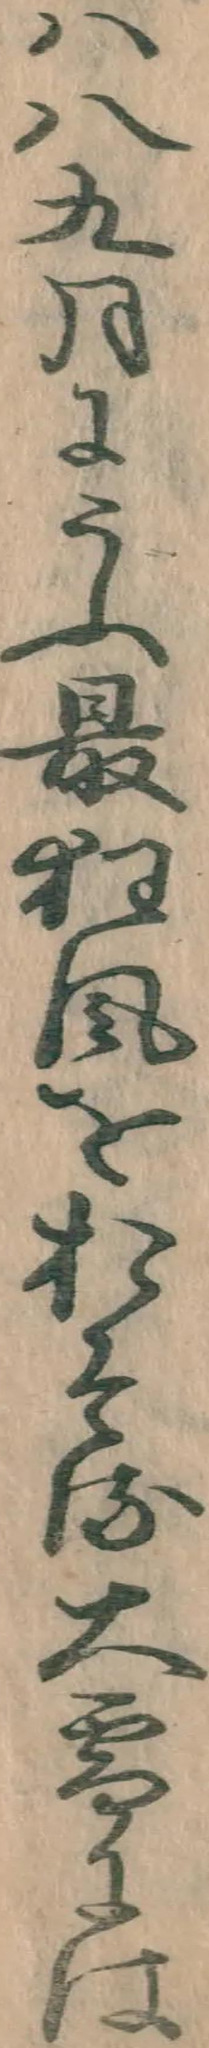は八九月にうふ最狂風をおそる大雪には
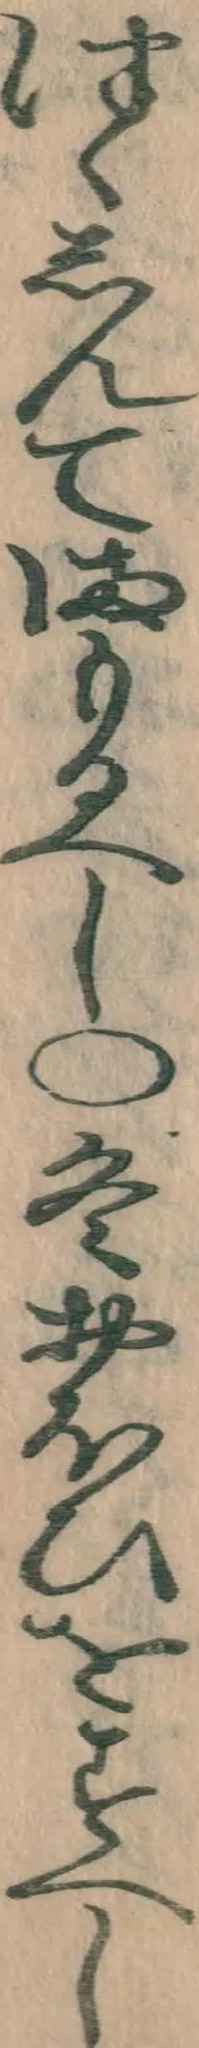つゝしんてまもるへし〇冬おほひをすへし
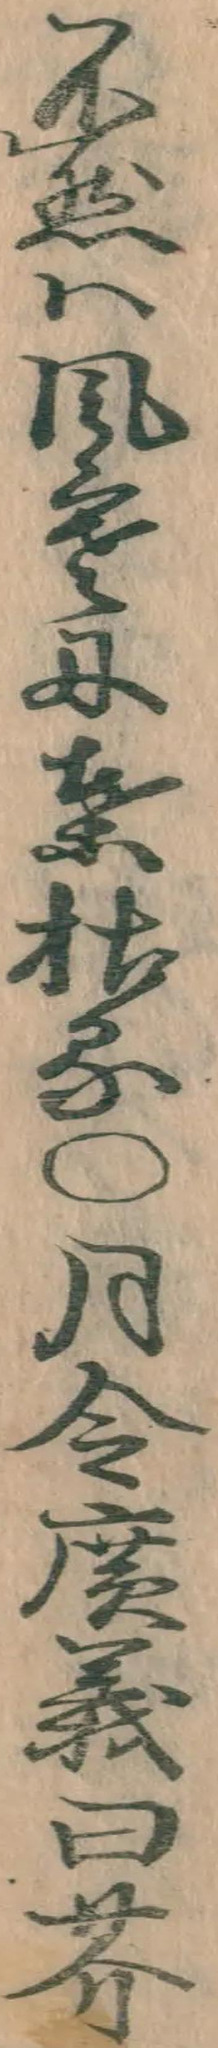不然は風寒に葉枯る〇月令広義日芥
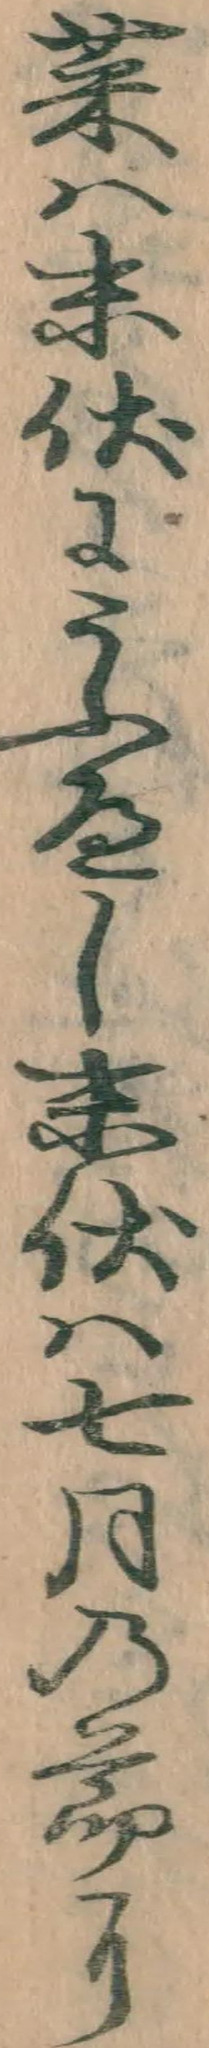菜は末伏にうふへし末伏は七月の節に
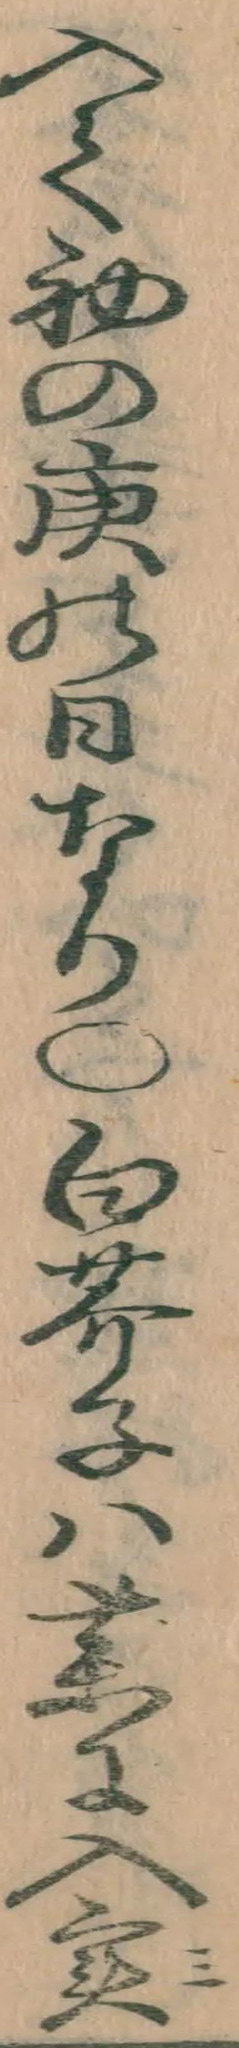入て初の庚の日なり〇白芥子は薬に入実
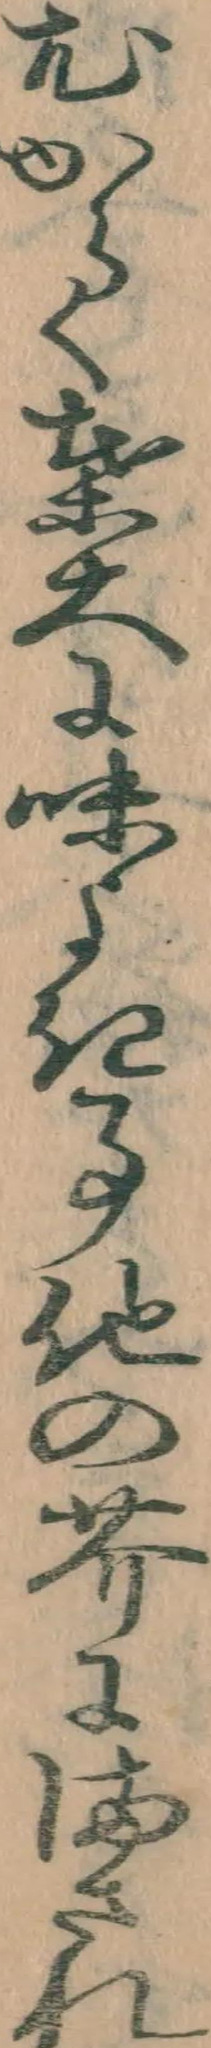尤からく葉大に味よき事他の芥にまされ
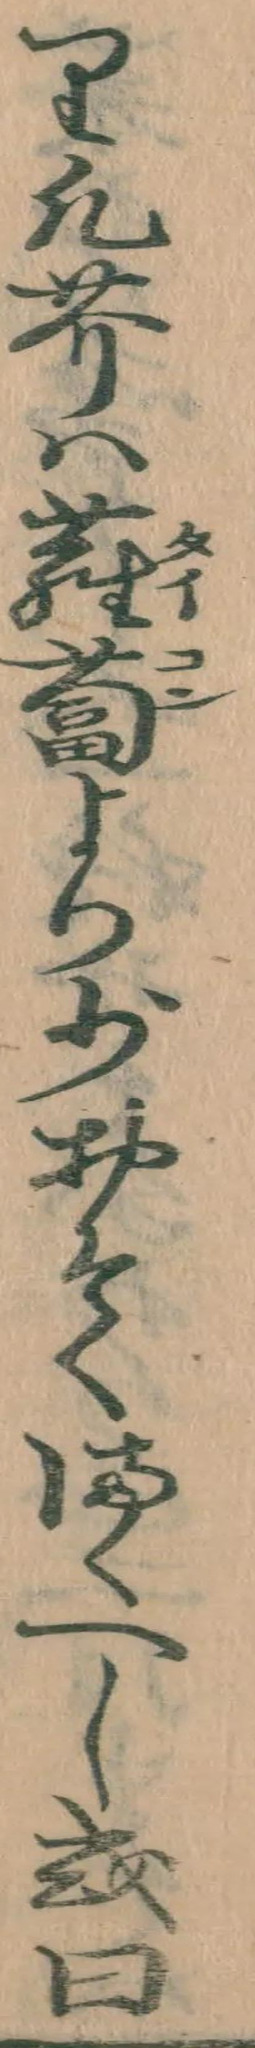り凡芥は蘿蔔より少おそくまくへし或日
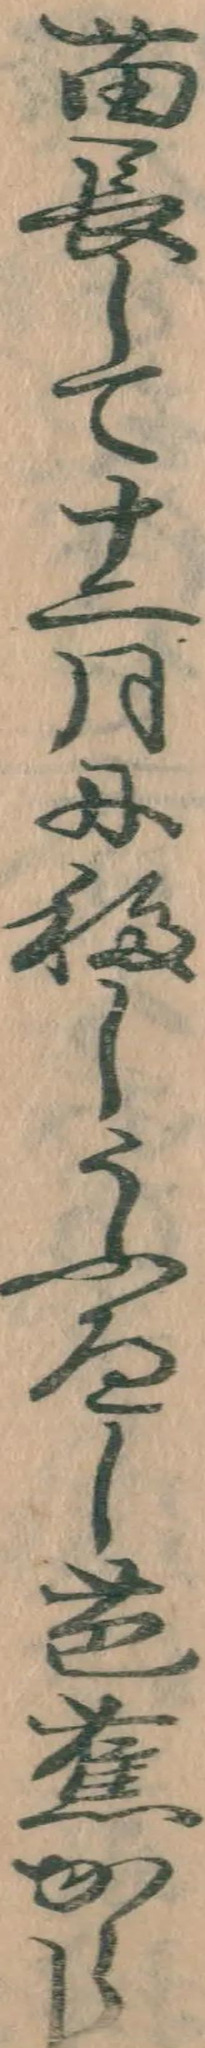苗長して十二月に移しうふへし芭蕉からし
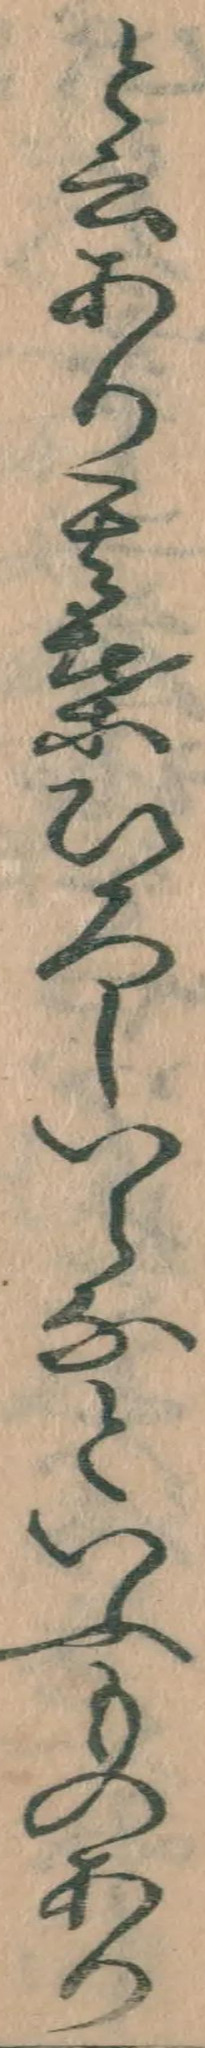と云あり其葉ひろしいらなといふものあり
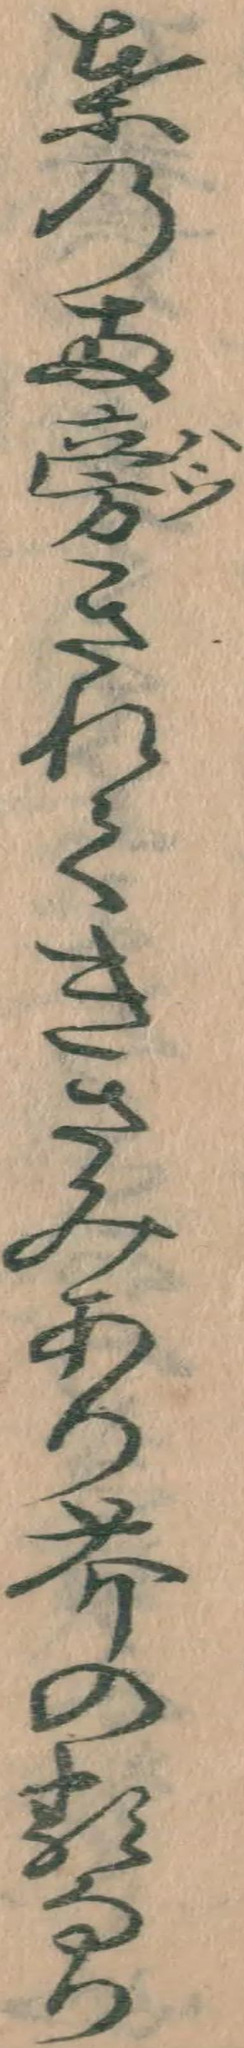葉の両旁きれてきさみあり芥の類なり
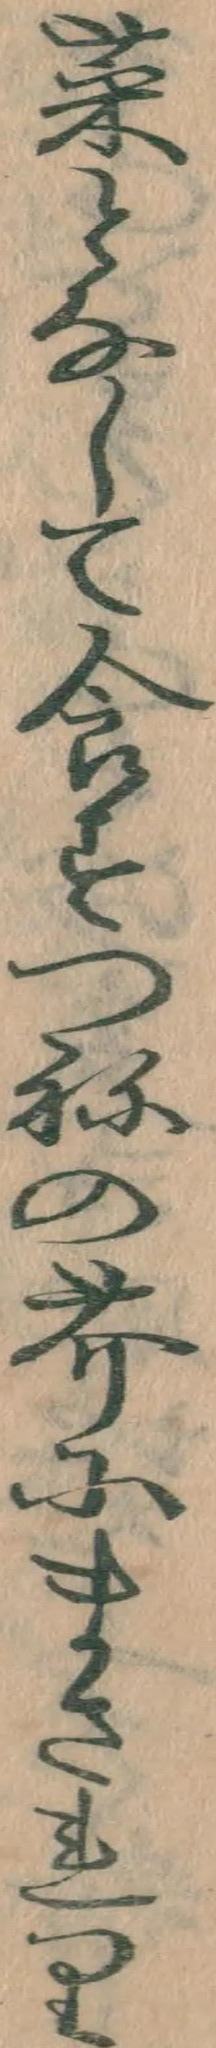菜となして食すつねの芥にまされり
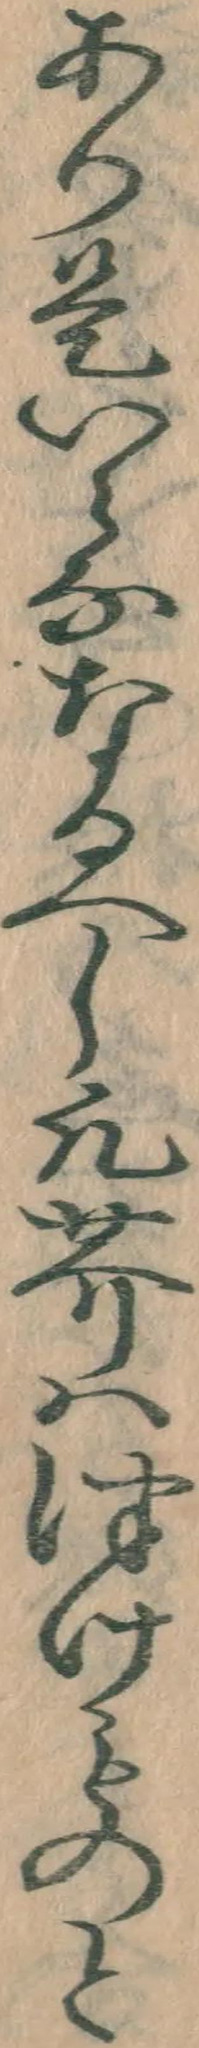あり是いらななるへし凡芥はつけものと
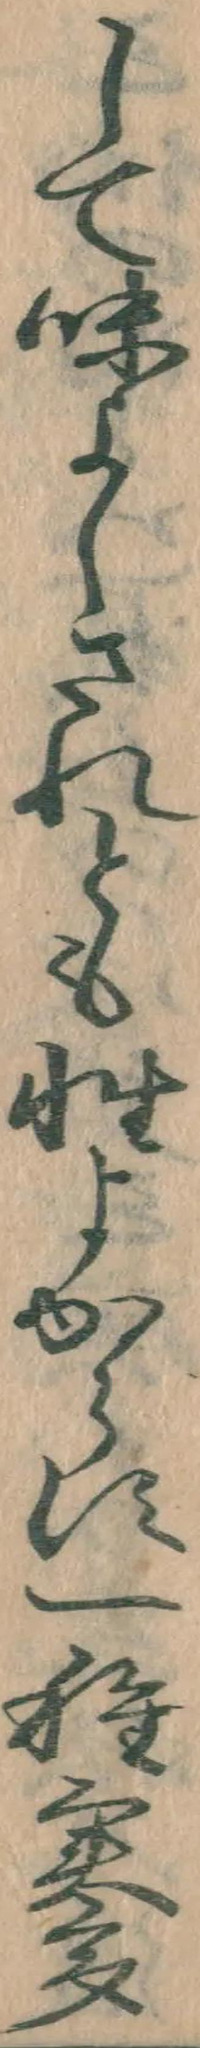して味よしされとも性よからす一種実多
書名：菜譜 3巻
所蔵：国立国会図書館 National Diet Library, JAPAN
